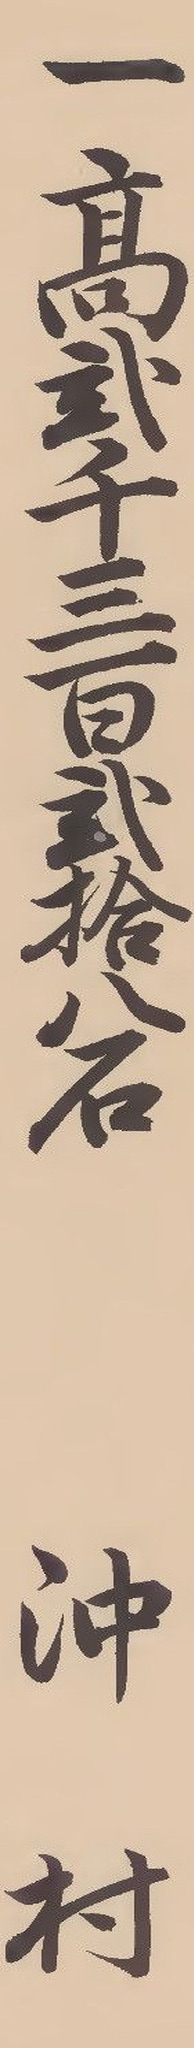一高弐千三百弐拾八石沖村
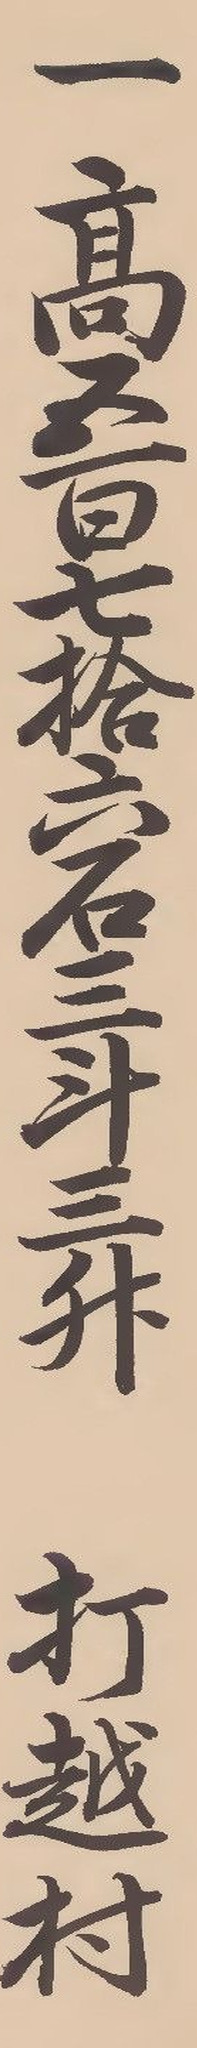一高五百七拾六石三斗三升打越村
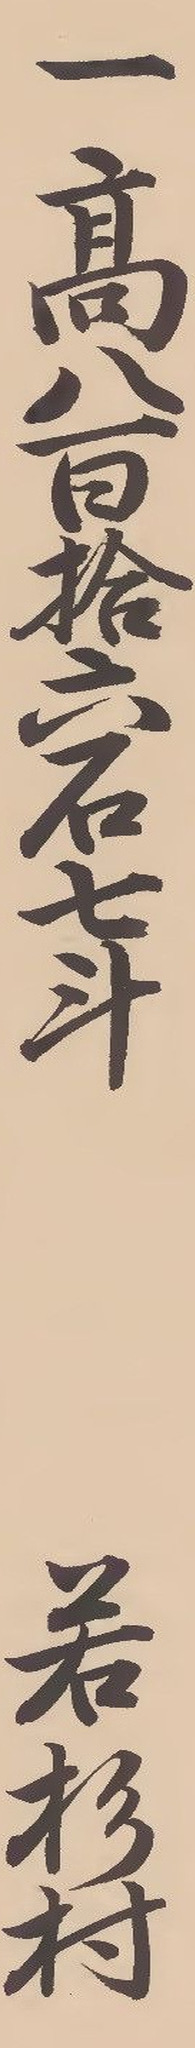一高八百拾六石七斗若杉村
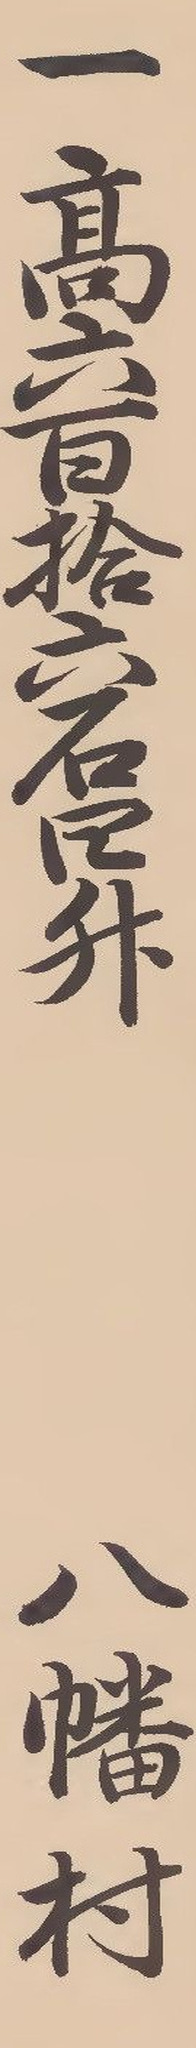一高六百拾六石四升八幡村
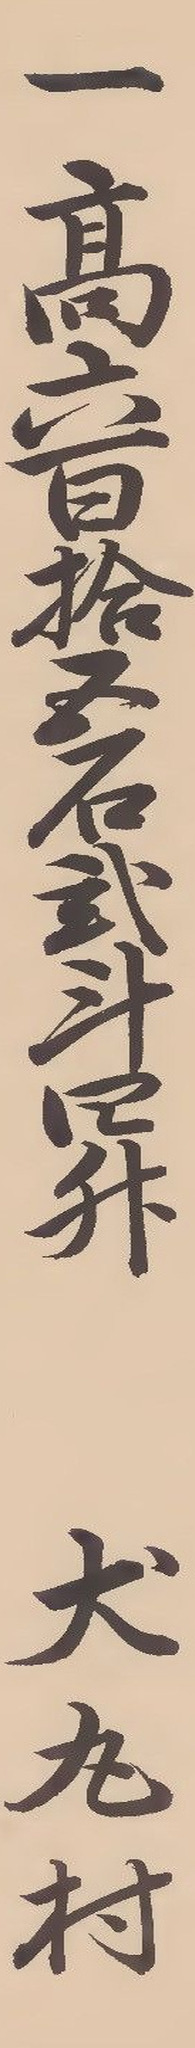一高六百拾五石弐斗四升犬丸村
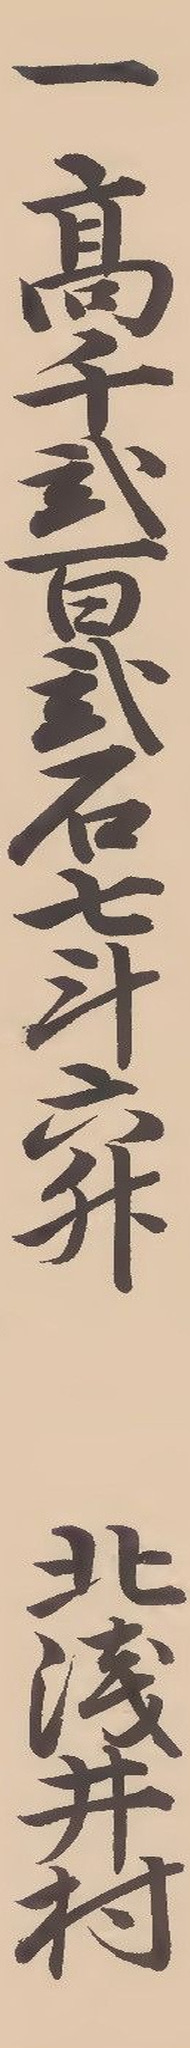一高千弐百弐石七斗六升北浅井村
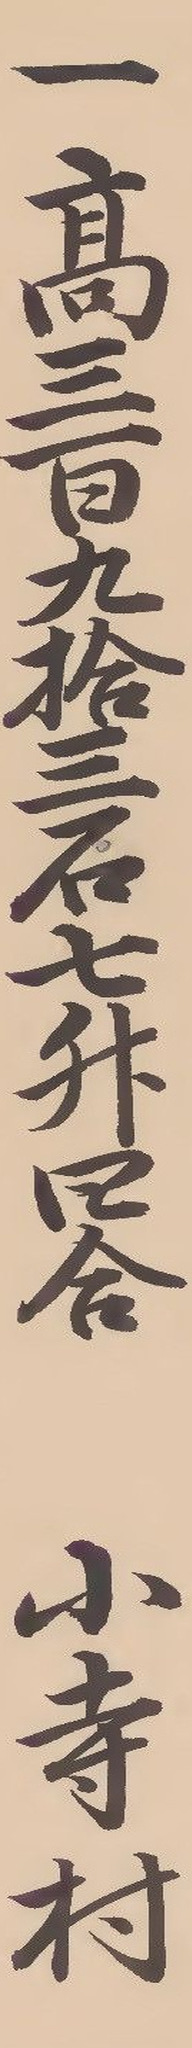一高三百九拾三石七升四合小寺村

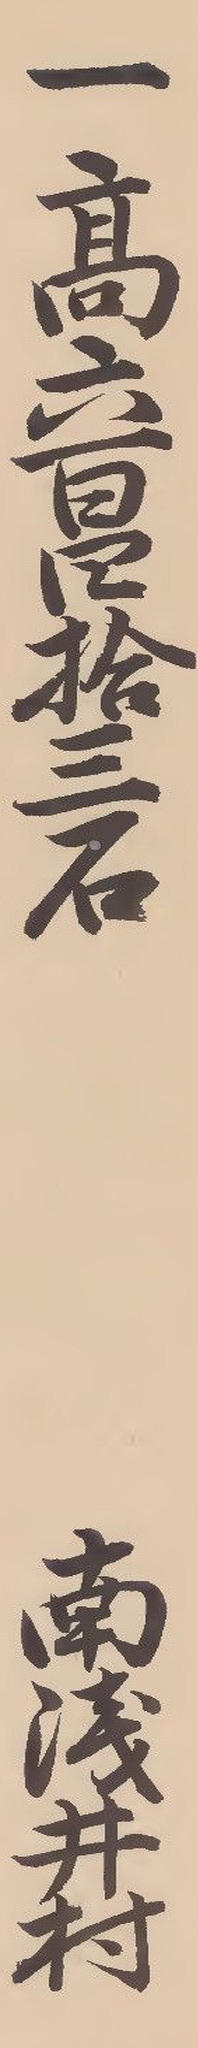一高六百四拾三石南浅井村
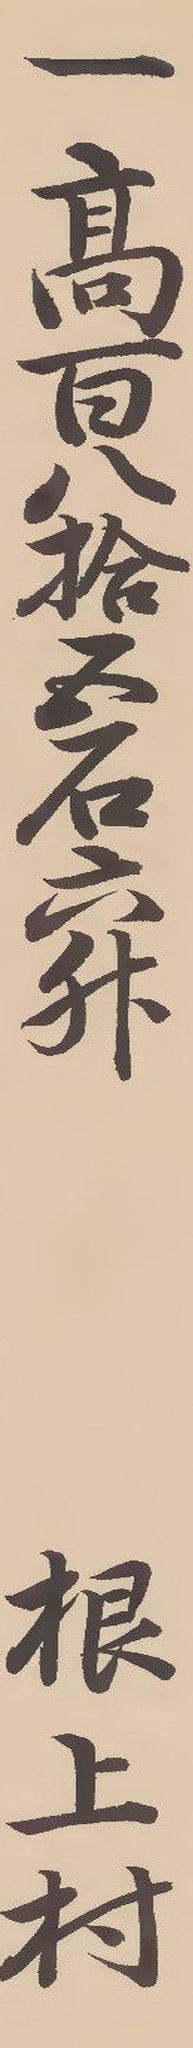一高百八拾五石六升根上村
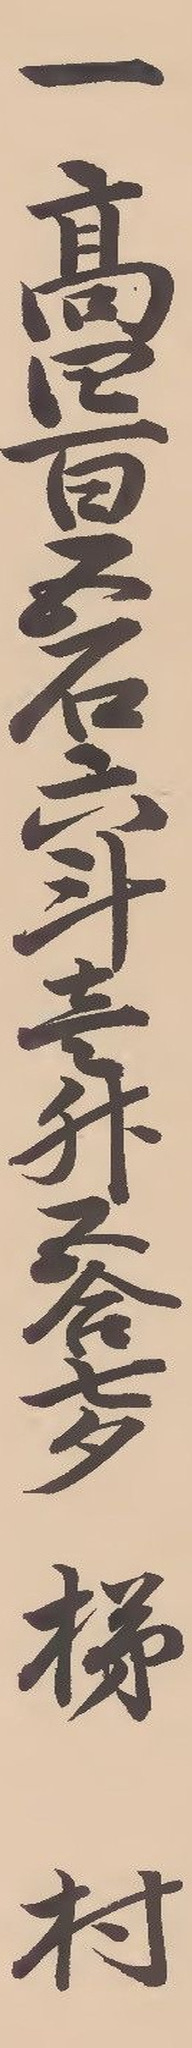一高四百五石六斗壱升五合七勺梯村
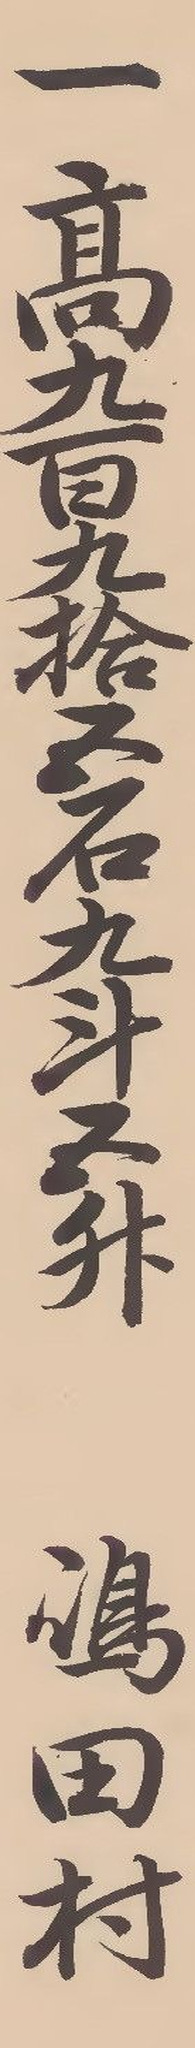一高九百九拾五石九斗五升島田村
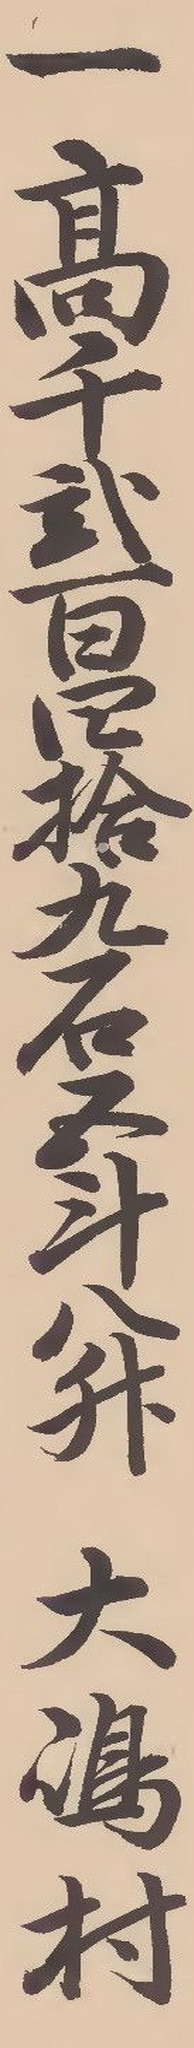一高千弐百四拾九石五斗八升大島村

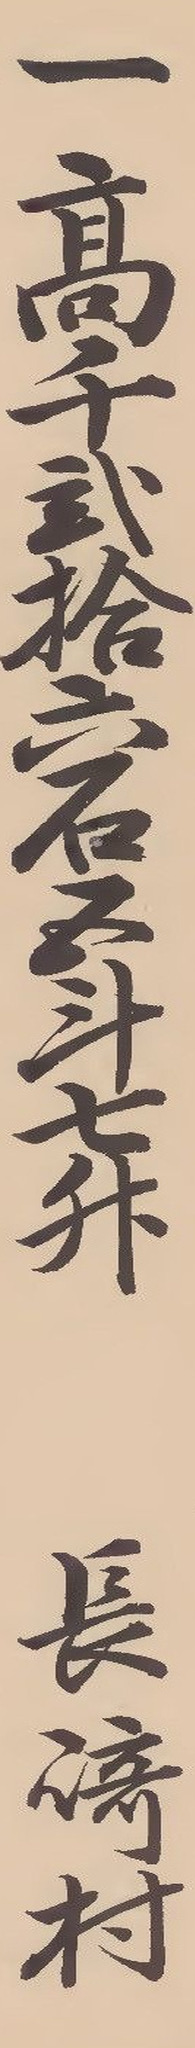一高千弐拾六石五斗七升長崎村
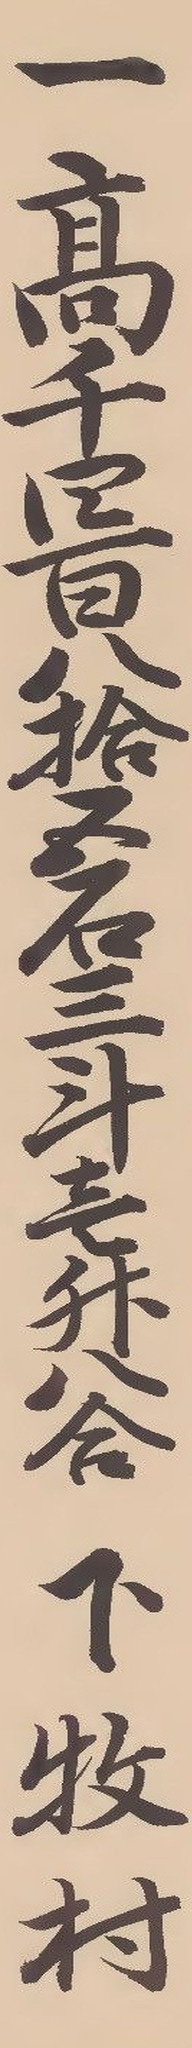一高千四百八拾五石三斗壱升八合下牧村
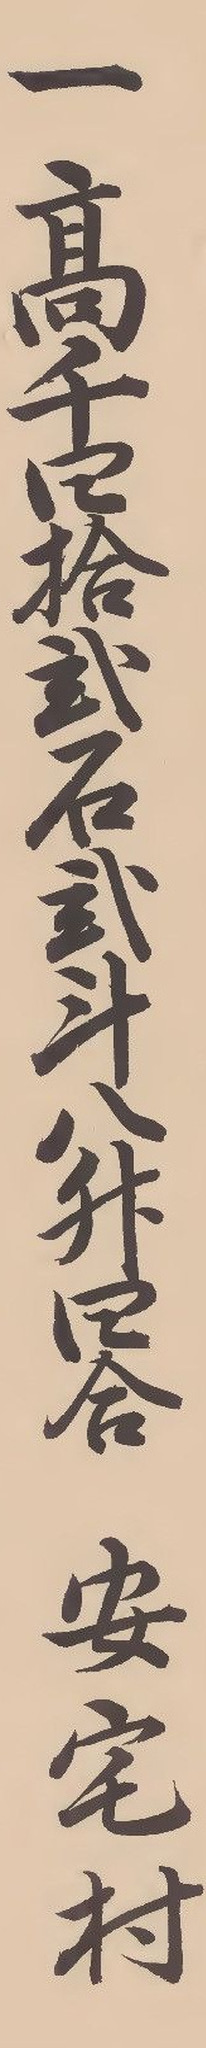一高千四拾弐石弐斗八升四合安宅村
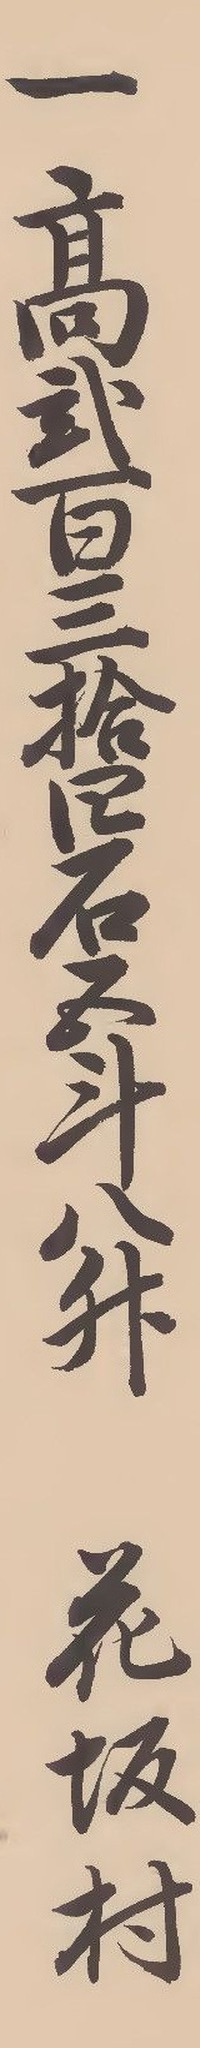一高弐百三拾四石五斗八升花坂村
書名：加賀国郷帳
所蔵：国立公文書館 National Archives of Japan
